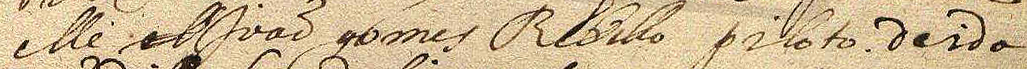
elle el Joaõ gomes Rebello piloto de ida
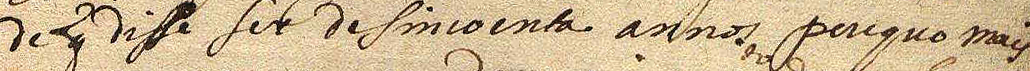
de q̄ disse ser de sincoenta annos pouquo mais
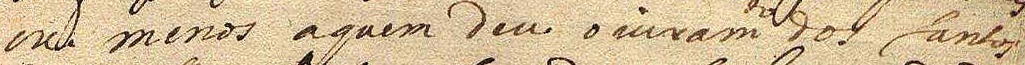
ou menos a quem deu o iuramto dos santos
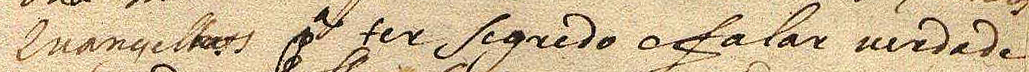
Euangelhos pa ter segredo e falar uerdade
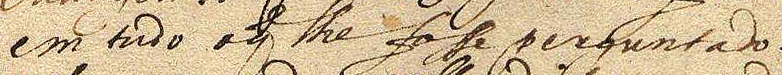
em tudo o q̄ lhe fosse perguntado.
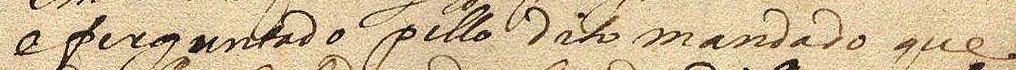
e perguntado pello dito mandado que
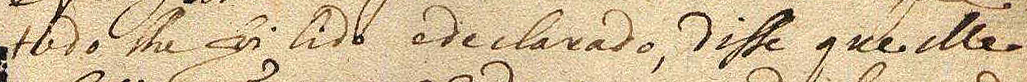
tudo lhe foi lido e declarado, disse que elle
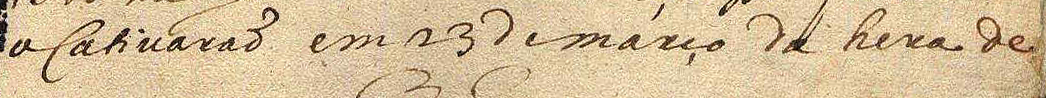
o Catiuaraõ em 23 de março da hera de
